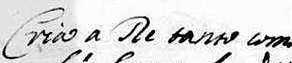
Cria a Re tanto como
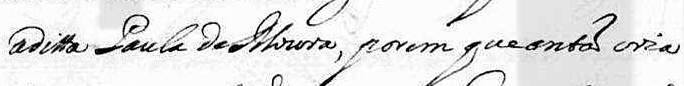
a ditta Paula de Moura, porem que entaõ cria
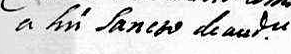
a hū Sancto de aud.u
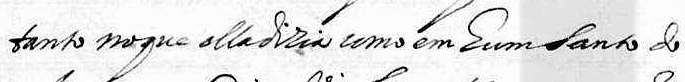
tanto no que ella dizia como em hum Santo do
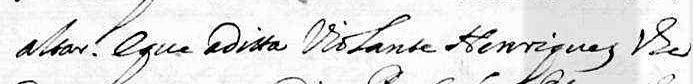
altar. E que a ditta Violante Henriques lhe
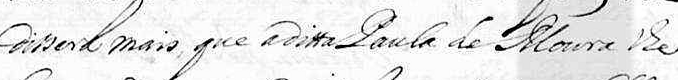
dissera mais que a ditta Paula de Moura lhe
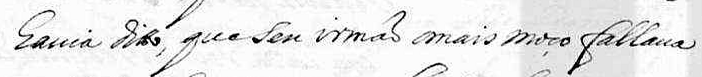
hauia ditto, que seu irmaõ o mais moço fallaua
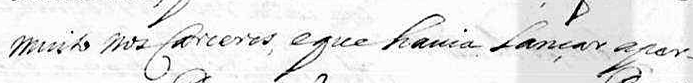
muito nos Carceres, e que hauia lançar a per
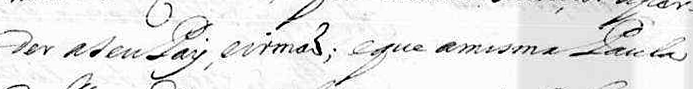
der a seu Pay, e irmaõ; e que a mesma Paula
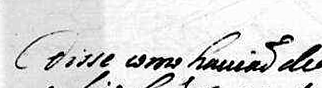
disse como hauiaõ de
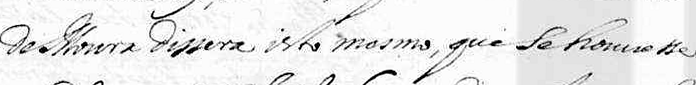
de Moura dissera isto mesmo, que se houuesse
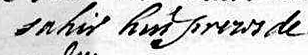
sahir hus̄ prezos de
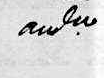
aud.u
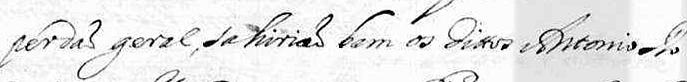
perdaõ geral sahiriaõ bem os dittos Antonio Ro
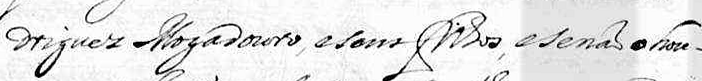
driguez Mogadouro, e seus filhos, e senão o hou
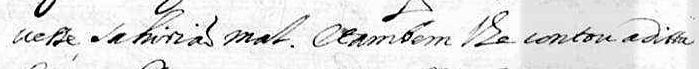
uesse sahiriaõ mal. e tambem lhe contou a ditta
